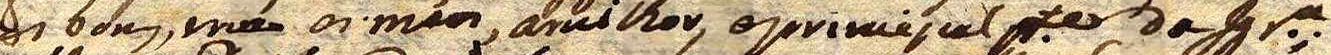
os bons, e não os máos, a milhor, e principal p.te da Jgr.a,
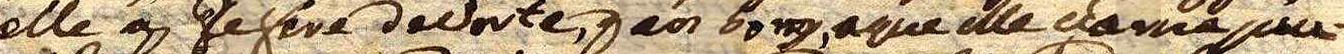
elle os refere de sorte, q̄ aos bons, a que elle chama pou
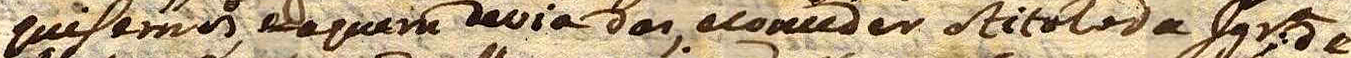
quissimos, e a quem devia dar, e conceder o titulo da Jgr.a, de
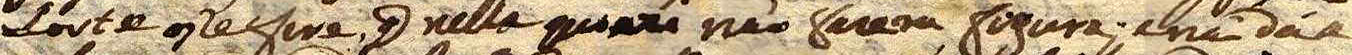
sorte os Refere q̄ nella quazi não fazem figura; e não dá a
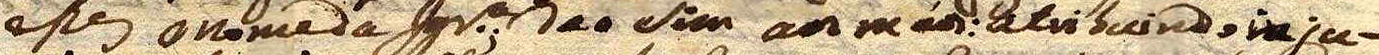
esses o nome da Jgr.a; da o sim aos máos: atribuindo inju
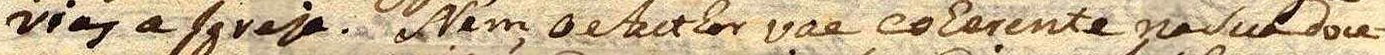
rias a Jgreja. Nem o Author vae coherente na sua dou
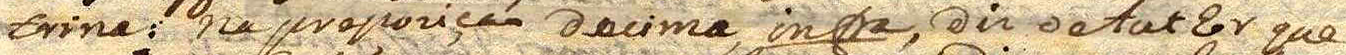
trina: na prepozição decima, infra, dis o Author que
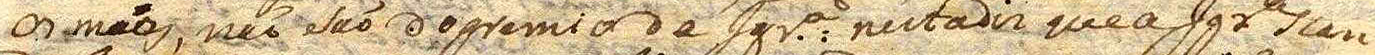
os máos, naõ saõ do gremio da Jgr.a: nesta diz que a Jgr.a scan
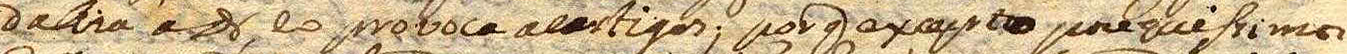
daliza a Ds̄. e o provoca a castigos; por q̄ excepto pouquissimos
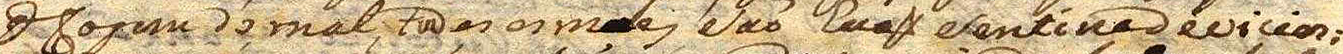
q̄ fogem do mal, todos os maes saõ hua sentina de vicios:
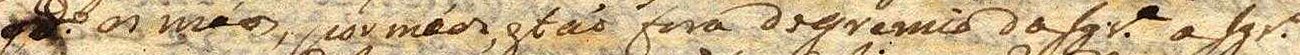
qd.o os máos, por máos, estão fora do gremio da Jgr.a a Jgr.a
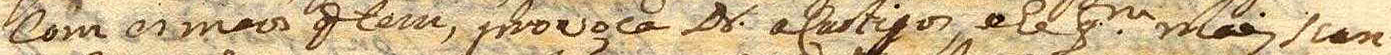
Com os maos q̄ tem, provoca Ds̄. a Castigos, e he q.m mais scan
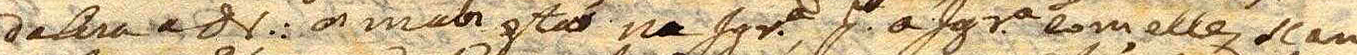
daliza a Ds̄.: os maos estaõ na Jgr.a p.a a Jgr.a com elles scan
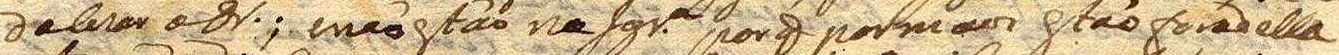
dalezar a Ds̄.; e naõ estão na Jgr.a porq̄ por maos estaõ fora della
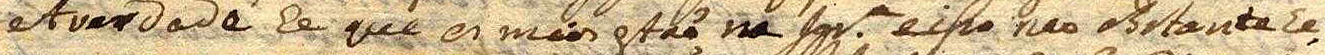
A verdade he que os máos estaõ na Jgr.a e isso nao obstante he
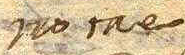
po rae
